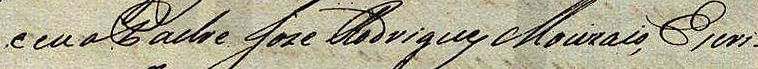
e eu o Padre Joze Rodrigues Mouzais, Escri
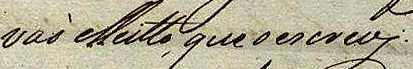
vaõ elleitto, que o escrevj.
